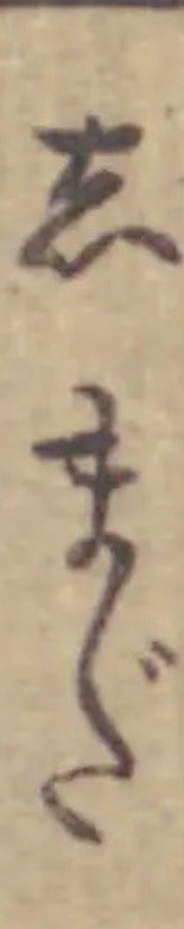しまだ
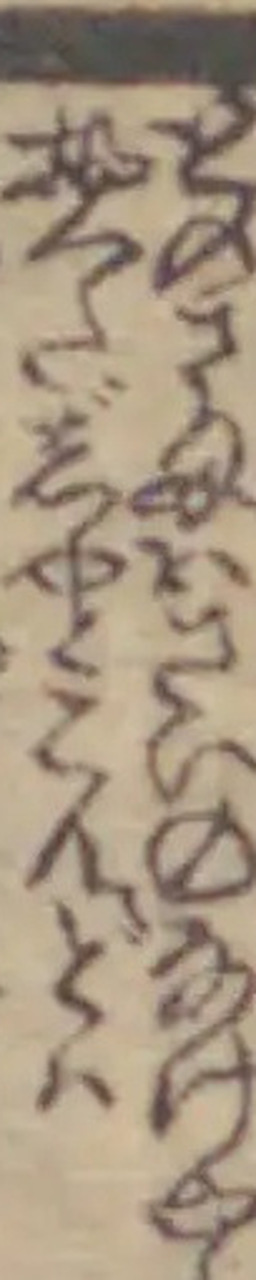おへたじやこんどは
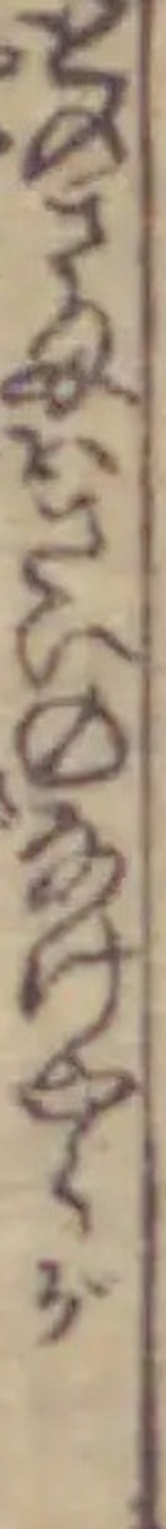とのさまはさいのなけやうが
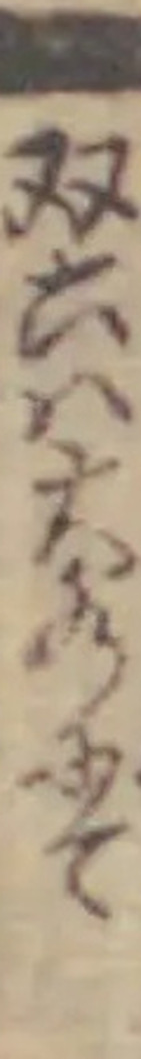双六は大水にて
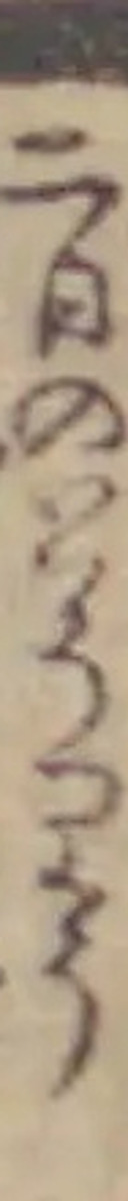二日のとうりう
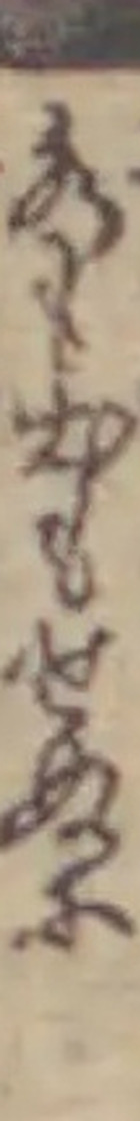水も出もせぬに
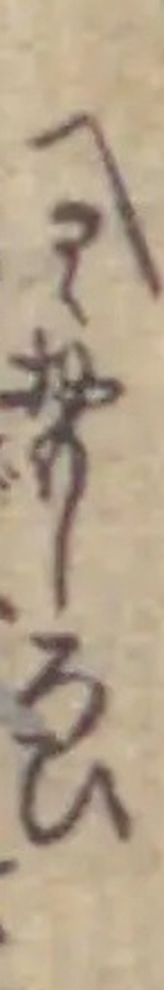〽アヽおもしろひ
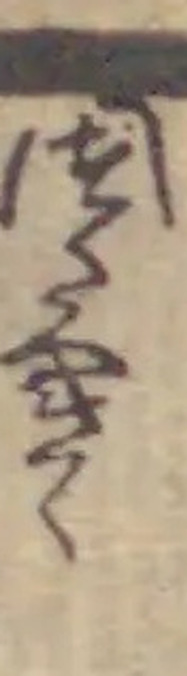〽つたへきく
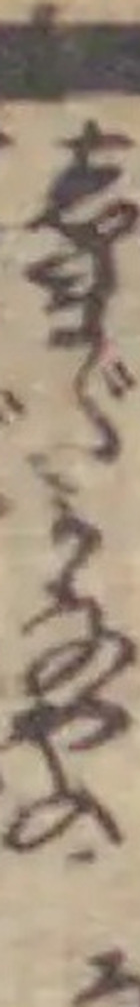しまだかなやの
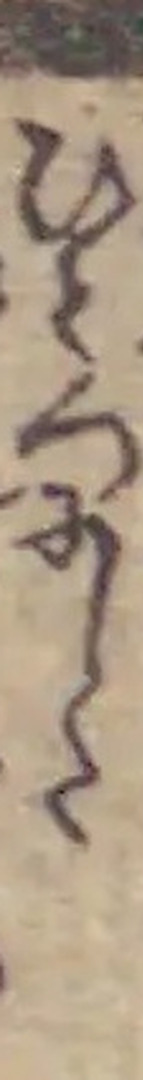ひとつにして
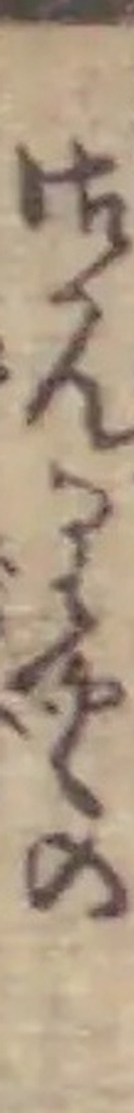御かんりやくの
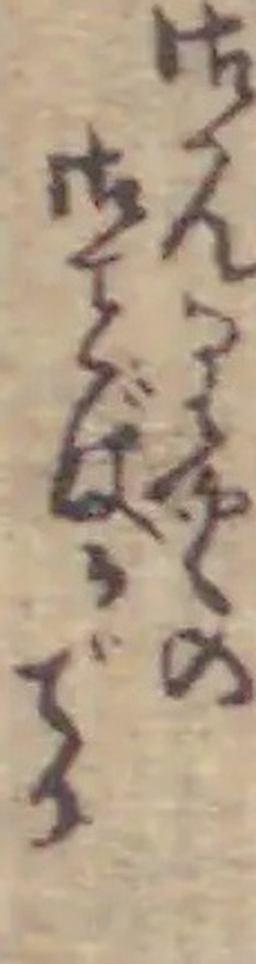御ことばかでる

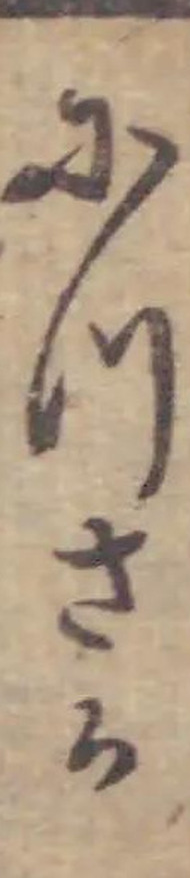につさか
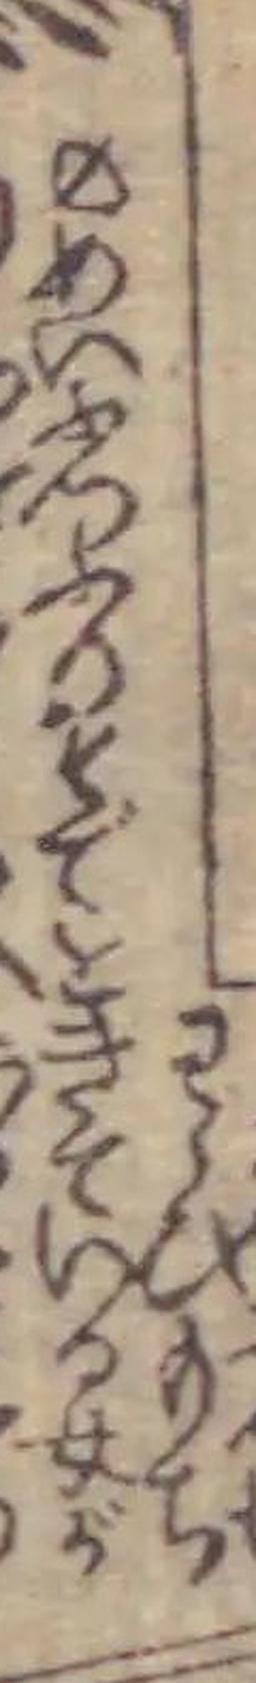のめいふつふりそでをきている女が
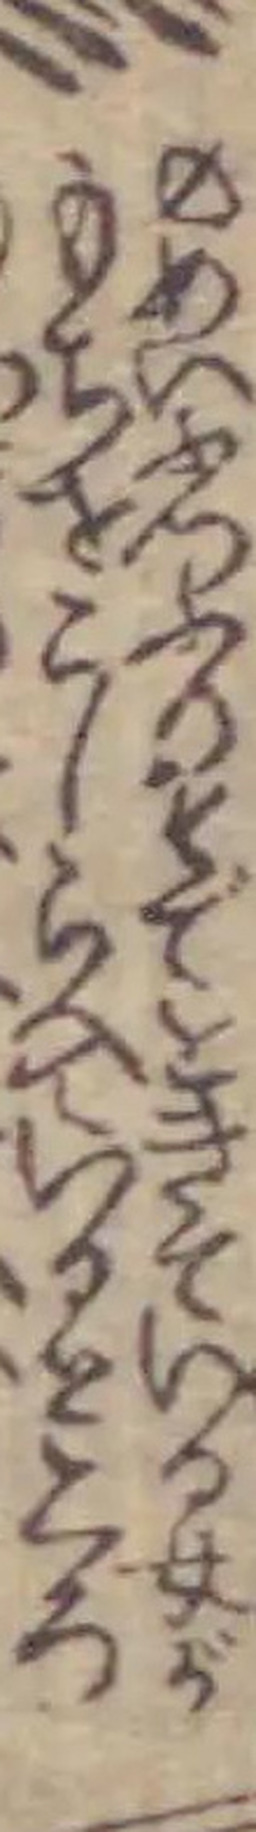もちをこしらへているところ
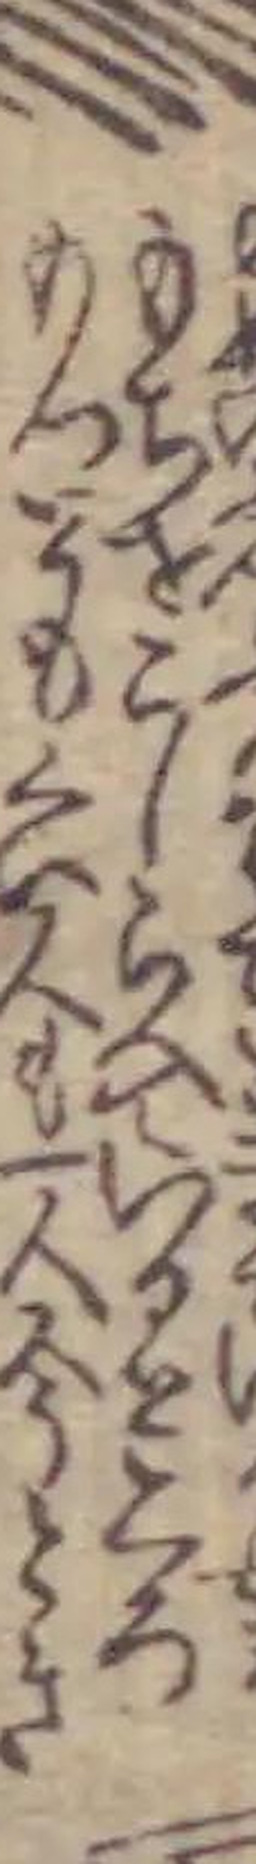もつともくい人も一人今とき
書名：道笑双六
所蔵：国立国会図書館 National Diet Library, JAPAN
